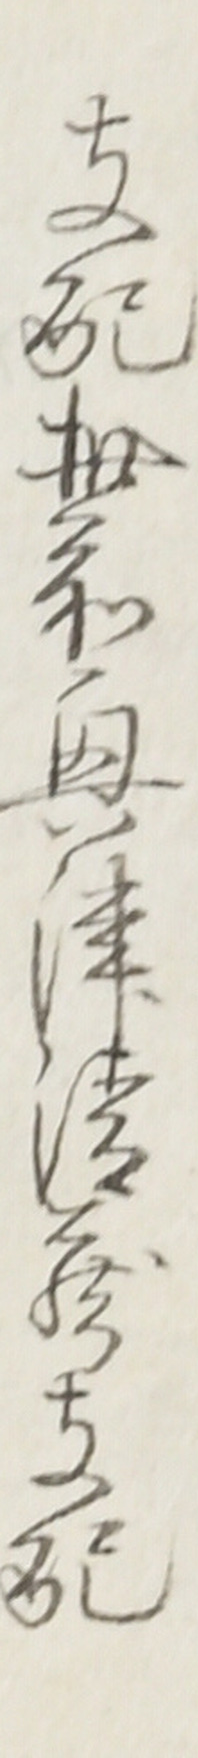支配此前奥津清蔵支配
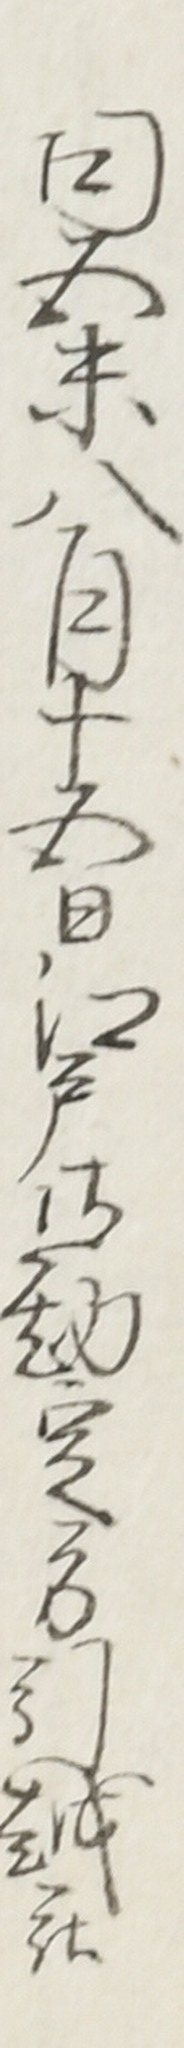一同五未八月十五日江戸御勘定方引越被
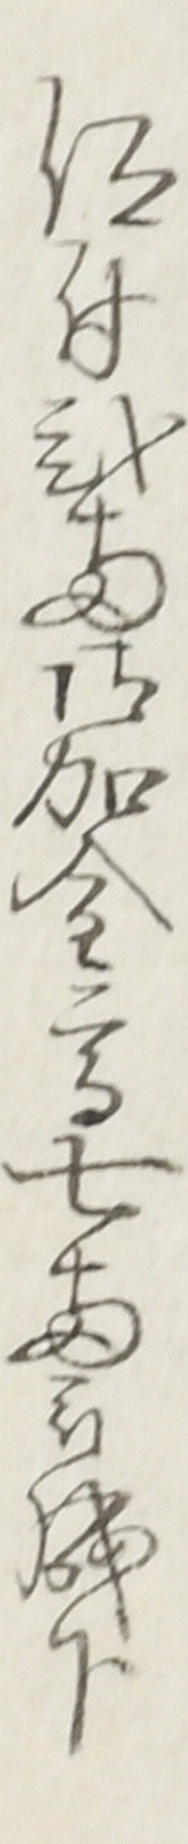仰付弐両御加金高七両被成下
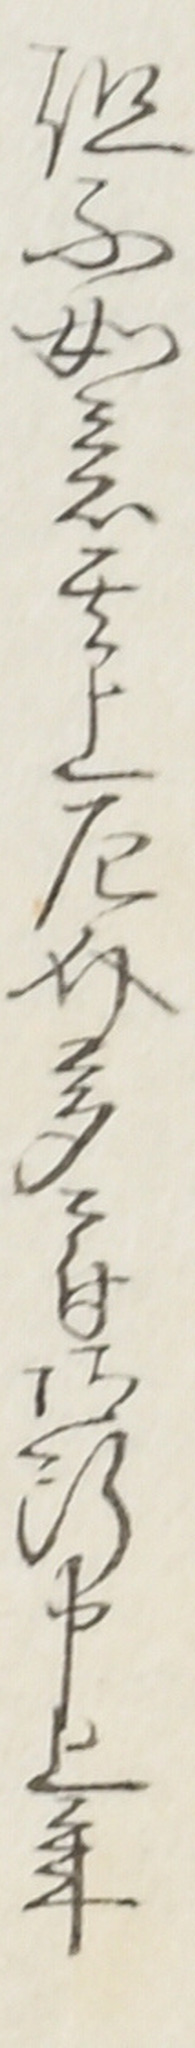但不如意其上厄介多ニ付御断申上年
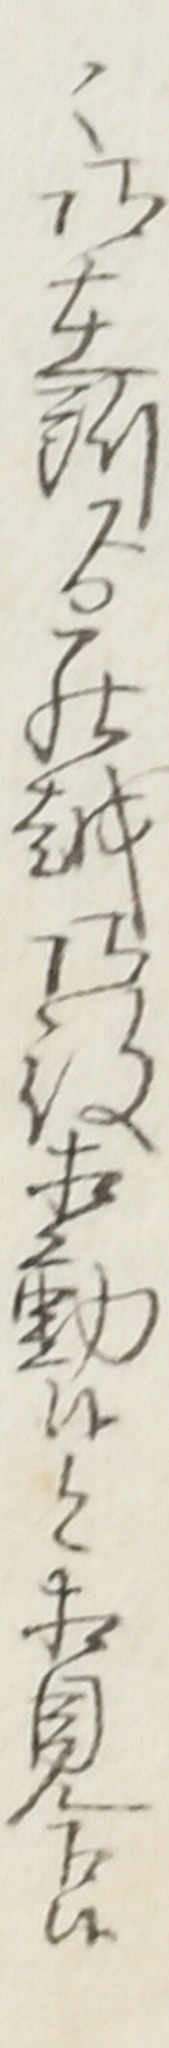々御在所ゟ罷越御役相勤候と相見江候
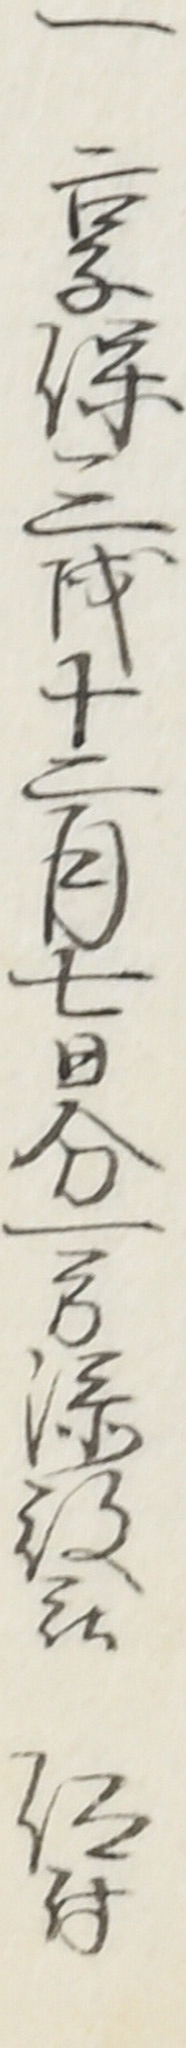一享保三戌十二月七日分一方添役被仰付
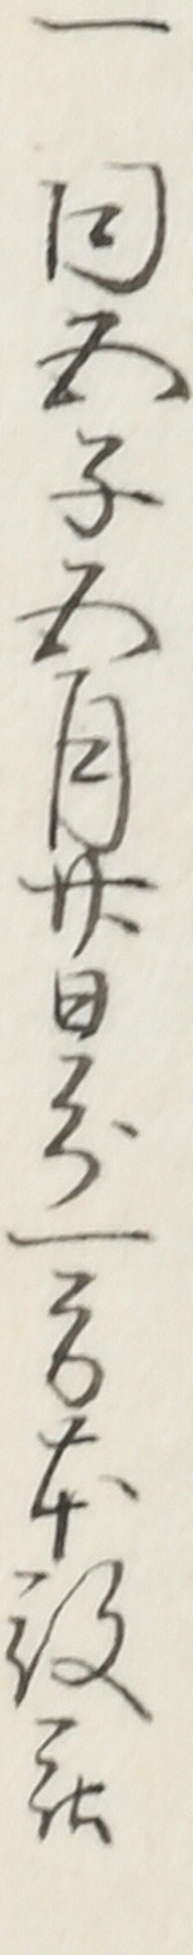一同五子五月廿日分一方本役被

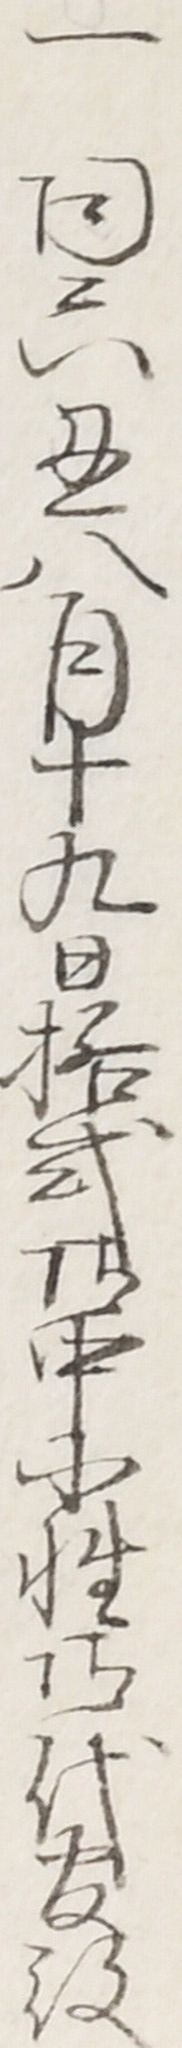一同六丑八月十九日格式御中小性御代官役
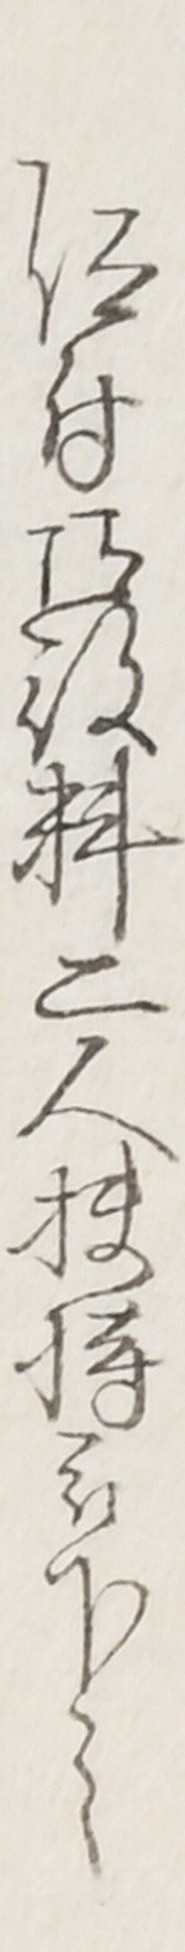被仰付御役料二人扶持被下之
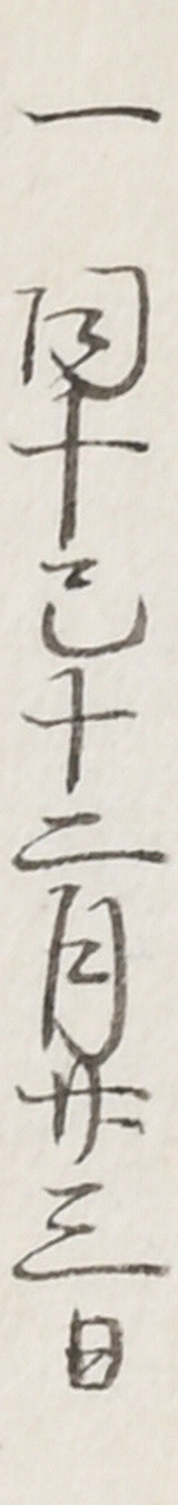一同十巳十二月廿三日
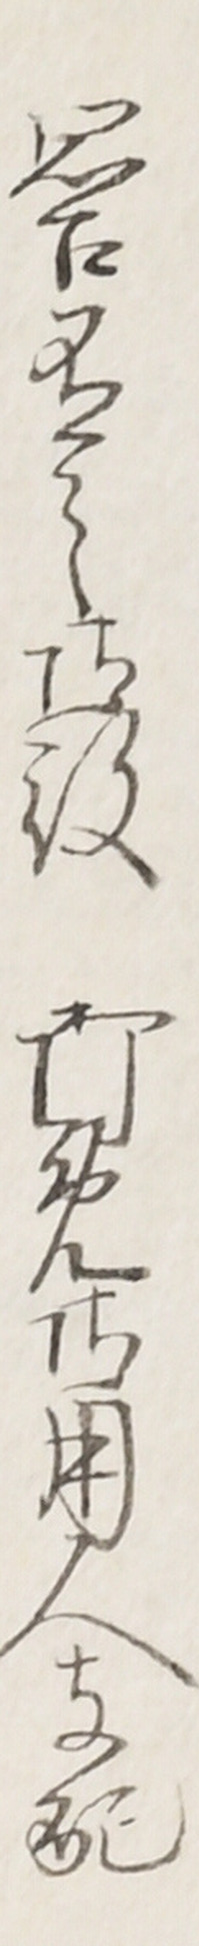思召有之御役御免御用人支配
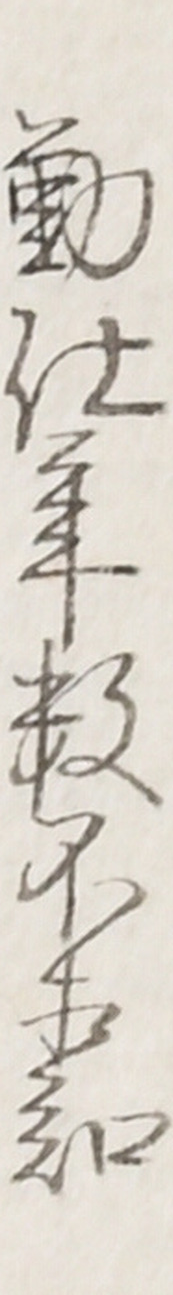勤仕年数不相知
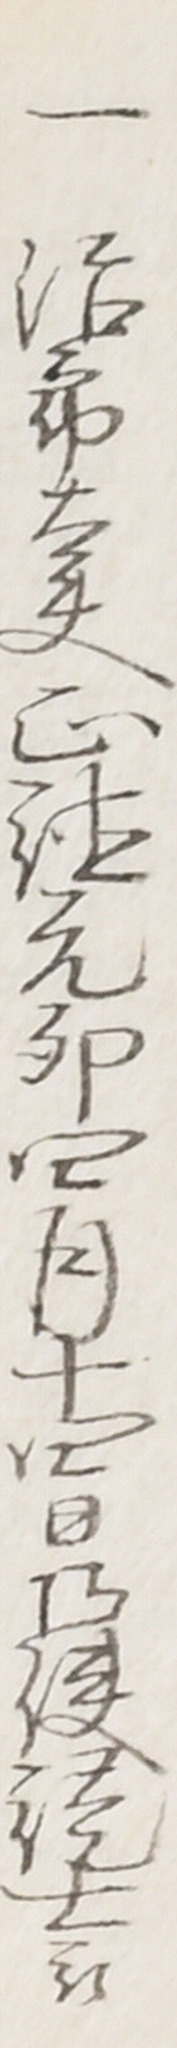一治郎太夫正徳元卯四月十四日御使徒士被
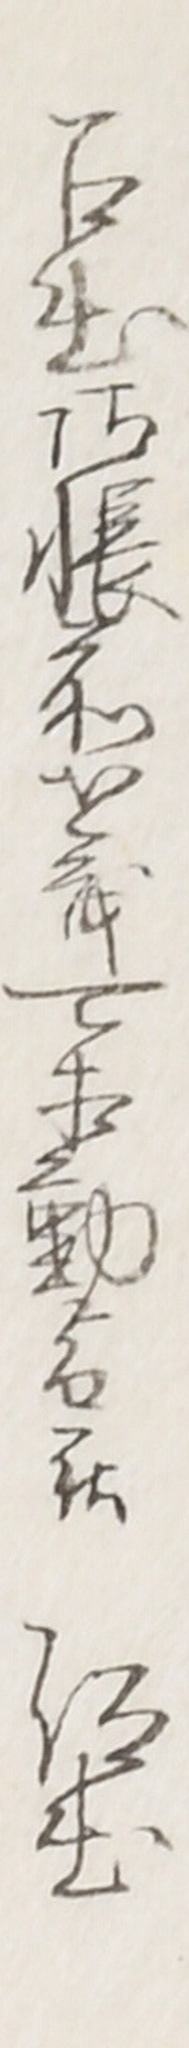召出御帳前を茂可相勤旨被仰出
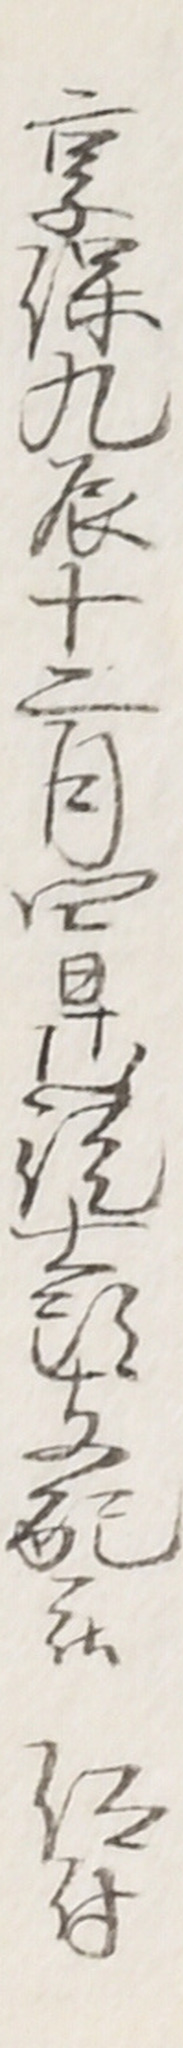一享保九辰十二月四月御徒士頭支配被仰付
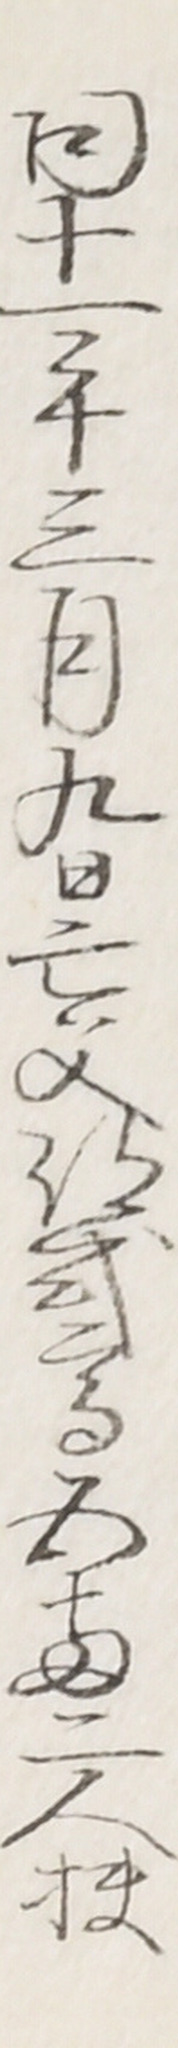一同十一午三月九日亡父跡式高五両二人扶
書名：給人諸士勤仕録（七）
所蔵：伊那市立高遠町図書館・合同会社AMANE
